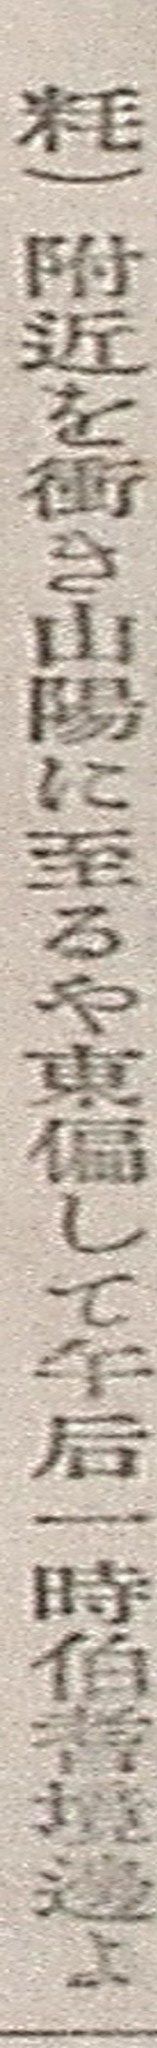粍）附近を衝き山陽に至るや東偏して午后一時伯耆境辺よ
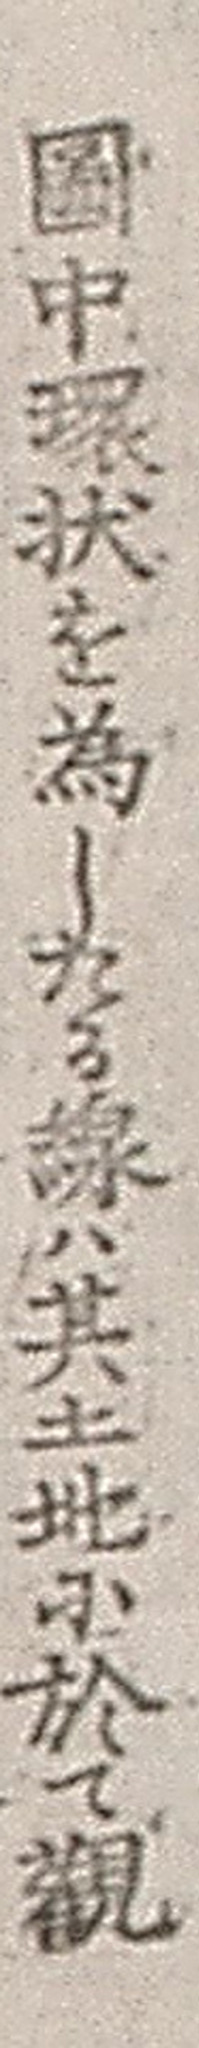図中環状を為したる線ハ其土地に於て観
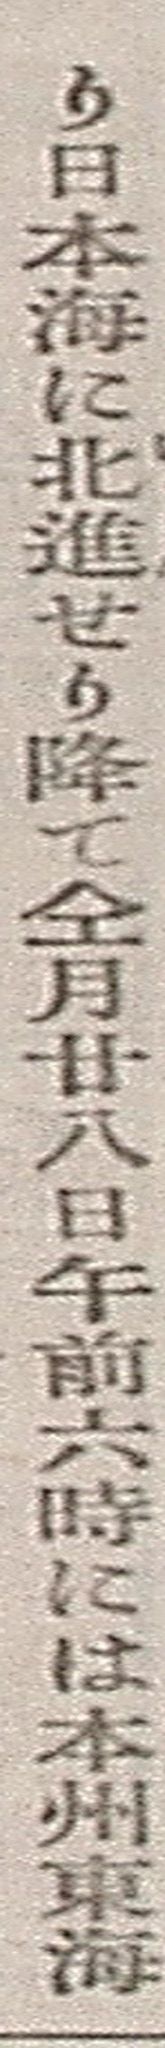り日本海に北進せり降て仝月廿八日午前六時には本州東海
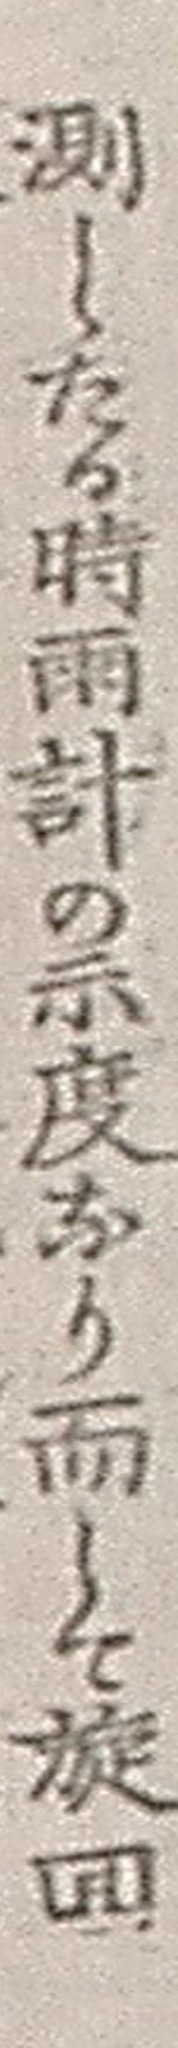測したる時雨計の示度なり而して旋回
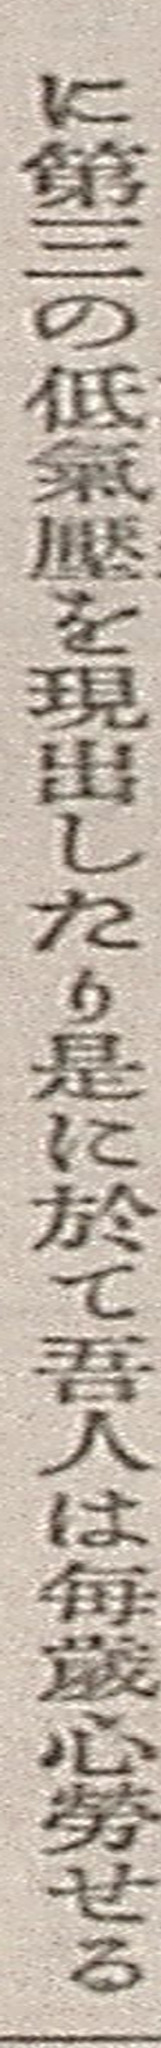に第三の低気圧を現出したり是に於て吾人は毎歳心労せる
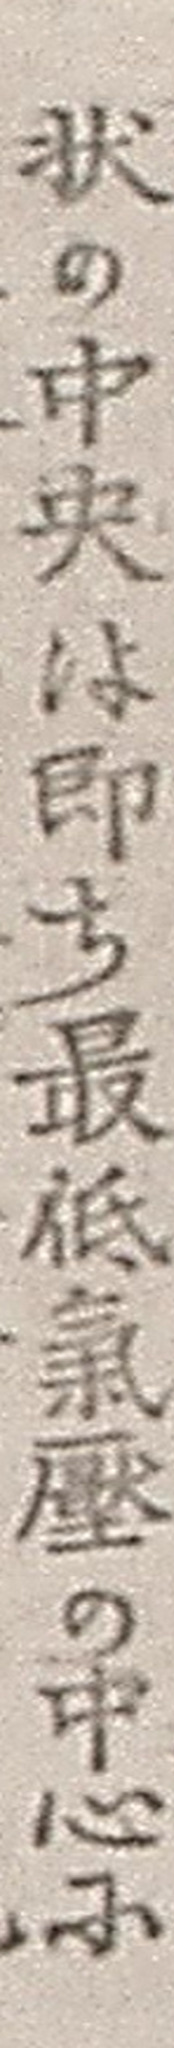状の中央は即ち最低気圧の中心に
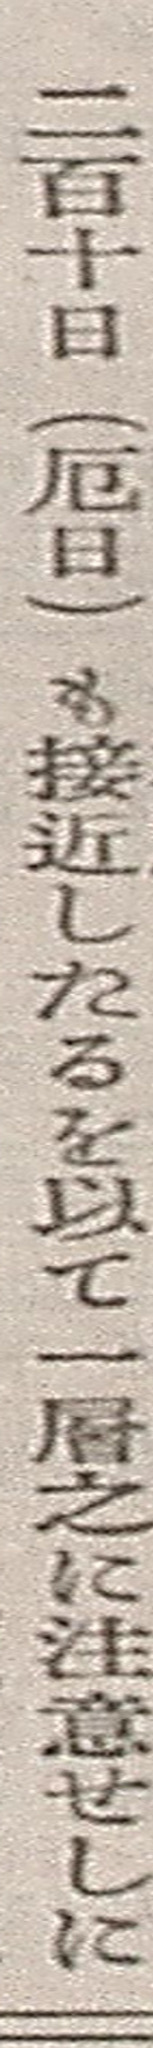二百十日も接近したるを以て一層之に注意せしに
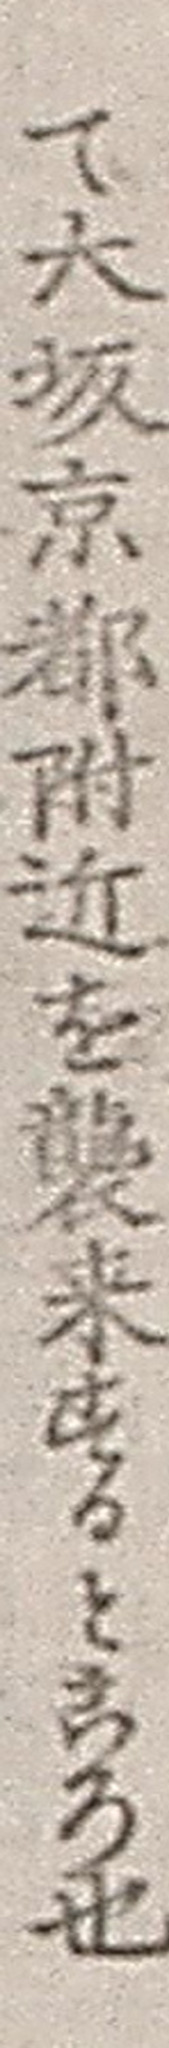て大坂京都附近を襲来するところ也
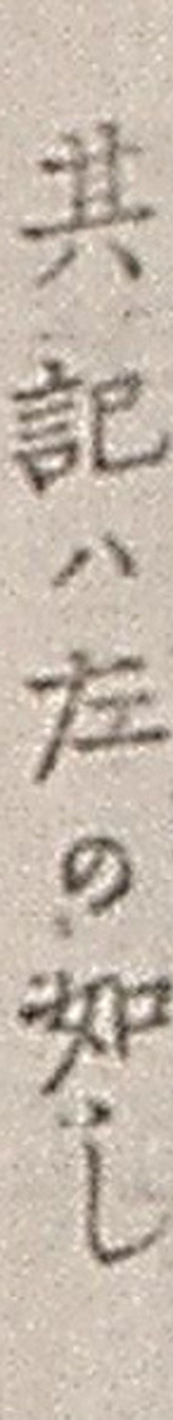其記ハ左の如し
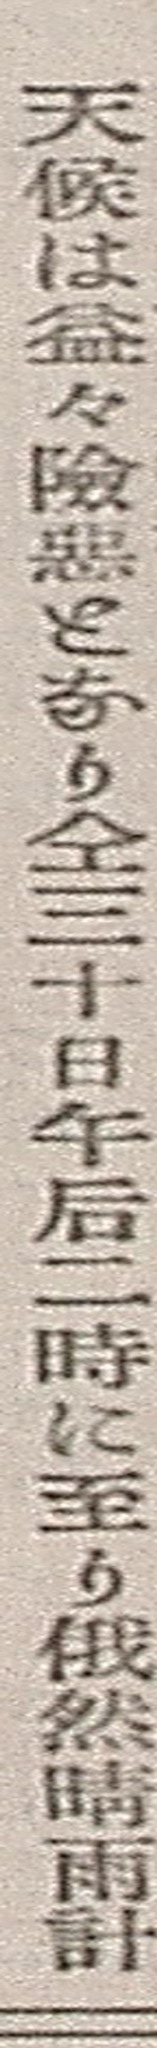天候は益々険悪となり仝三十日午后二時に至り俄然晴雨計
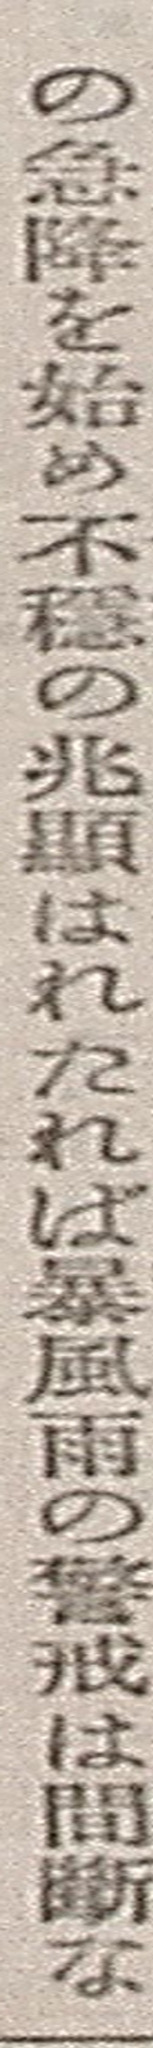の急降を始め不穏の兆顕はれたれば暴風雨の警戒は間断な
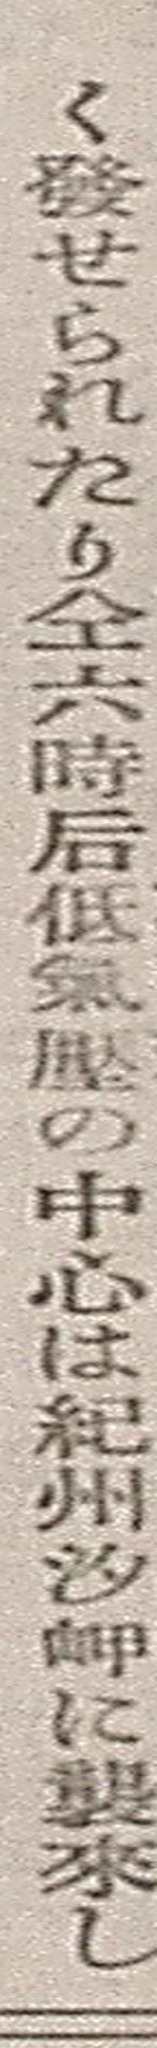く発せられたり仝六時后低気圧の中心は紀州汐岬に襲来し
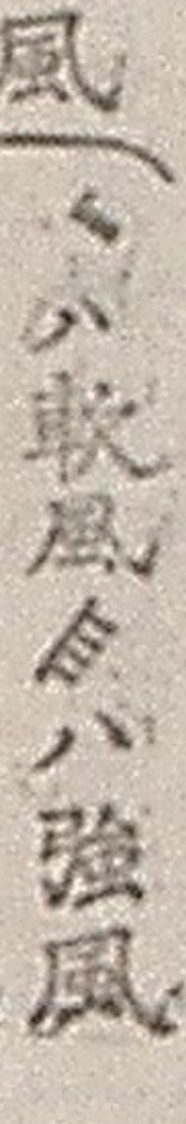風ハ軟風ハ強風
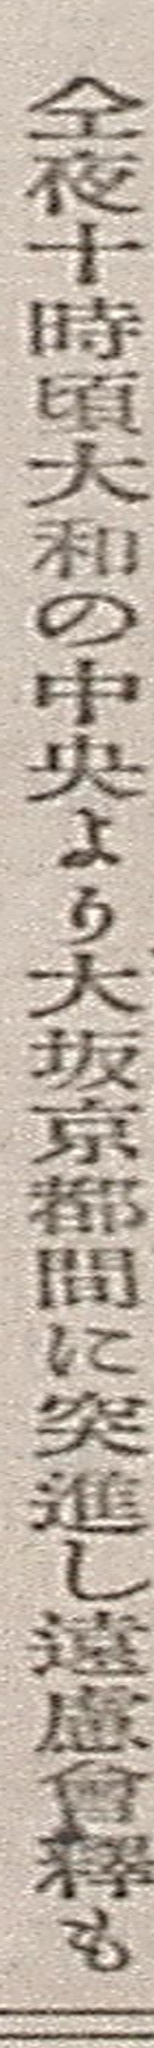仝夜十時頃大和の中央より大坂京都間に突進し遠慮会釈も
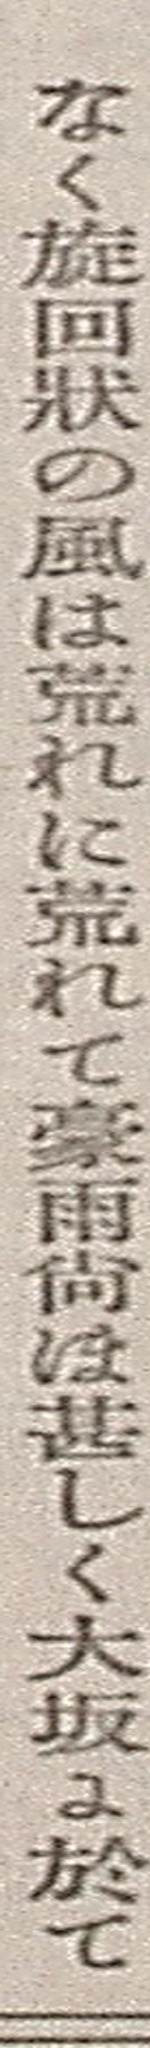なく旋回状の風は荒れに荒れて豪雨尚ほ甚しく大坂に於て
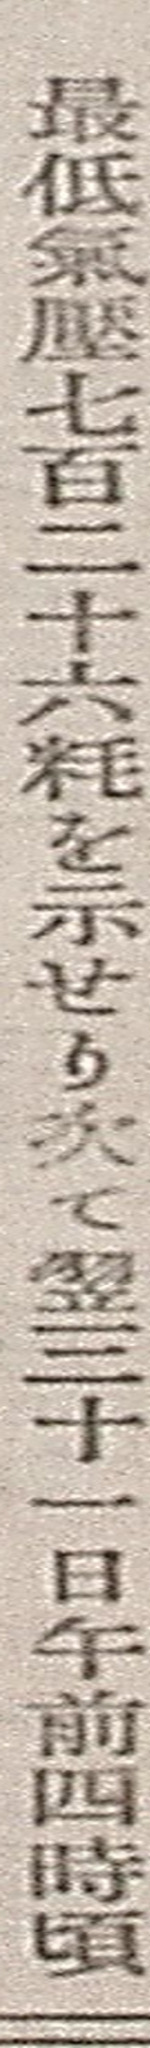最低気圧七百二十六粍を示せり次て翌三十一日午前四時頃
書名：風俗畫報臨時増刊第百二十四號　洪水地震被害録（上）
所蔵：東京大学地震研究所図書室 Earthquake Research Institute Library, The University of Tokyo, JAPAN
